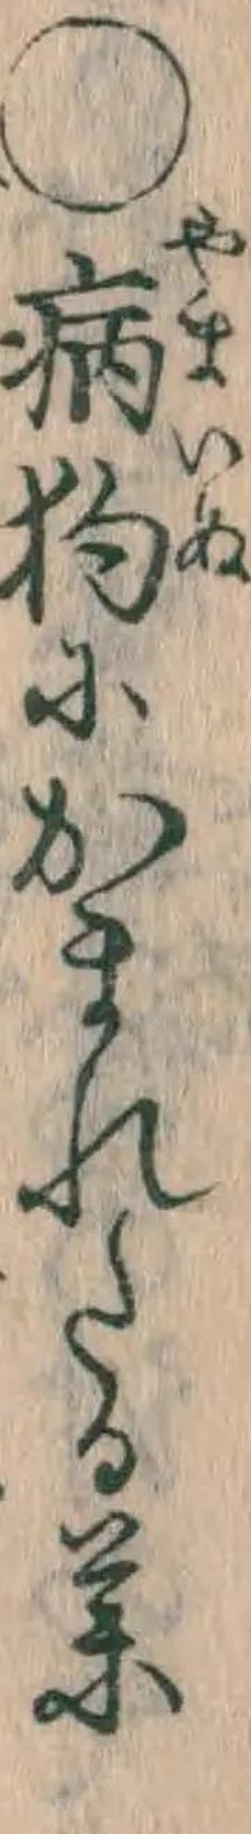○病狗にかまれたる薬
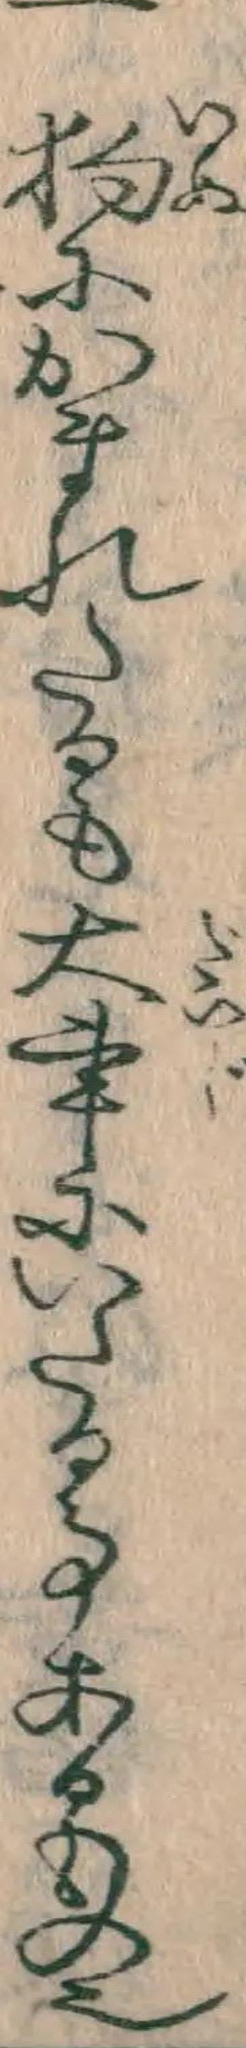一狗にかまれたるも大事にいたる事あるもの也
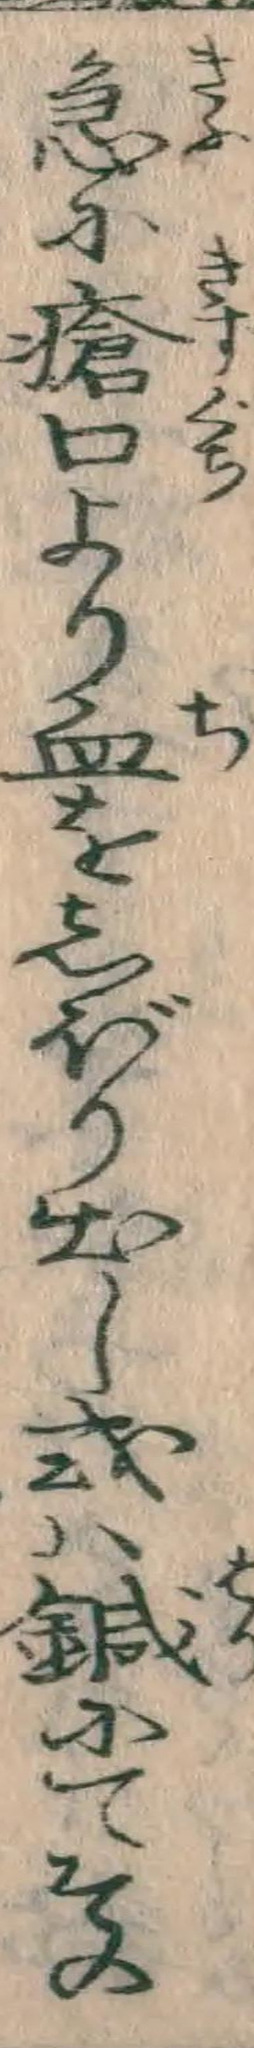急に瘡口より血をしぼり出し或は鍼にてその
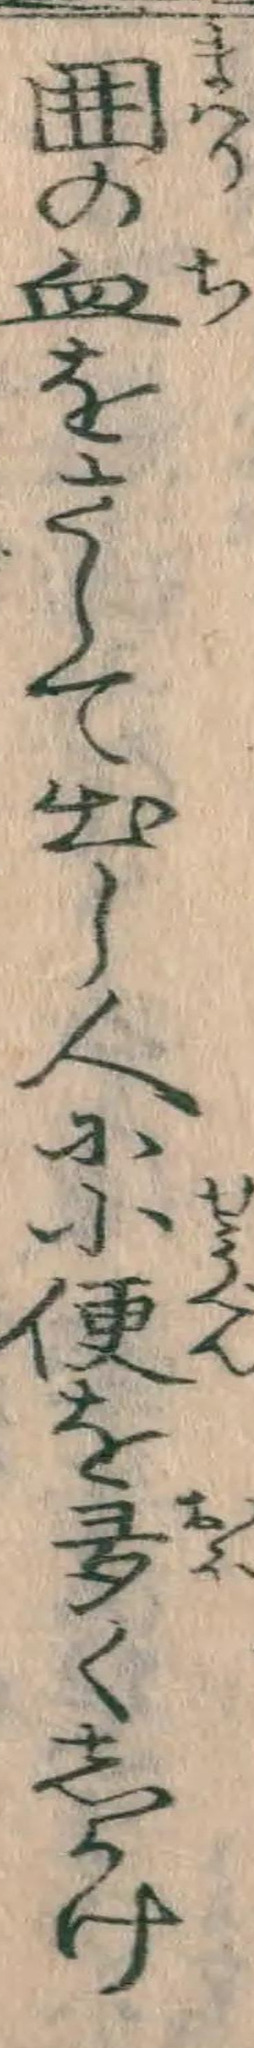囲の血をさして出し人に小便を多くしかけ
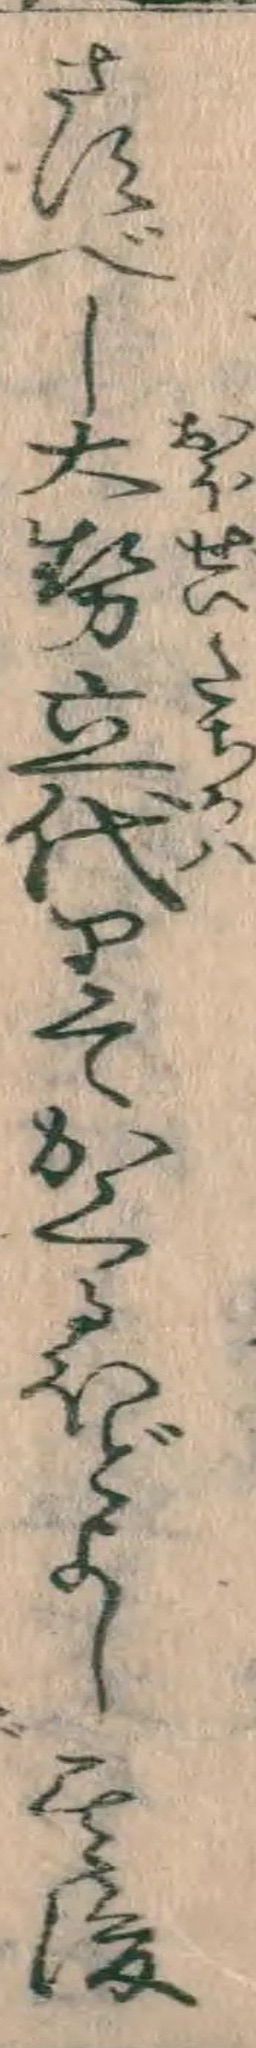さすべし大勢立代りてかくるほどよし其後
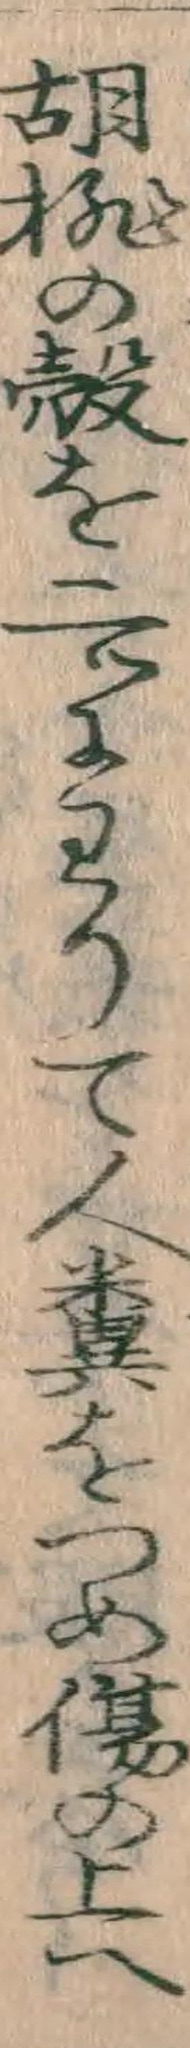胡桃の殻を二ッにわりて人糞をつめ傷の上へ
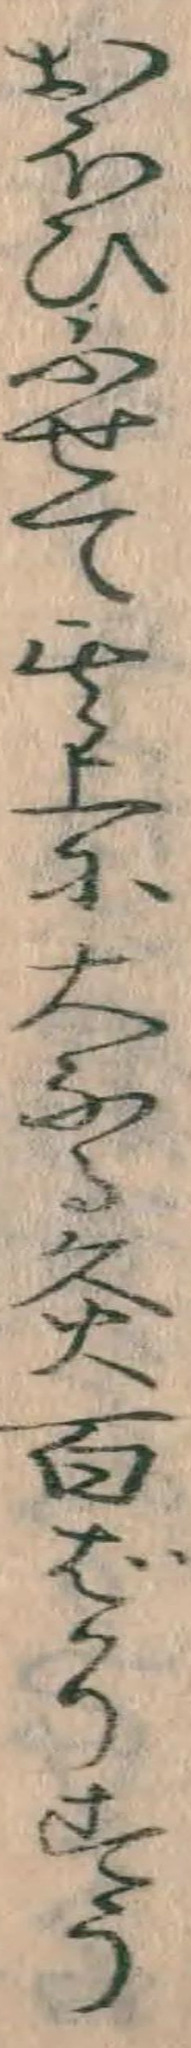おほひふせて其上に大なる灸百ばかりすう
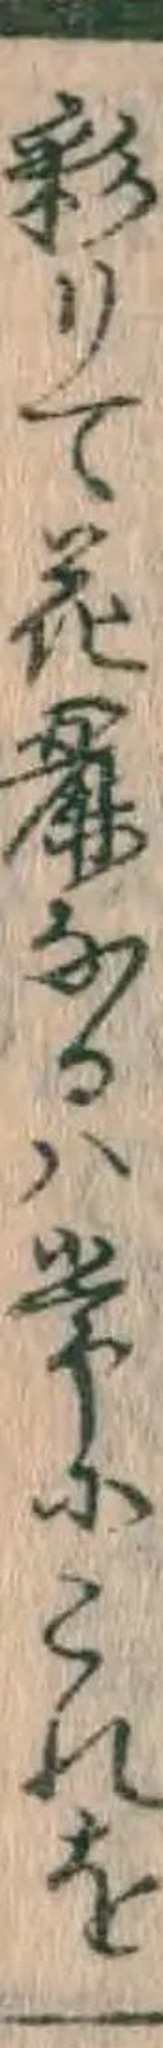彩りて花麗なるは常にこれを
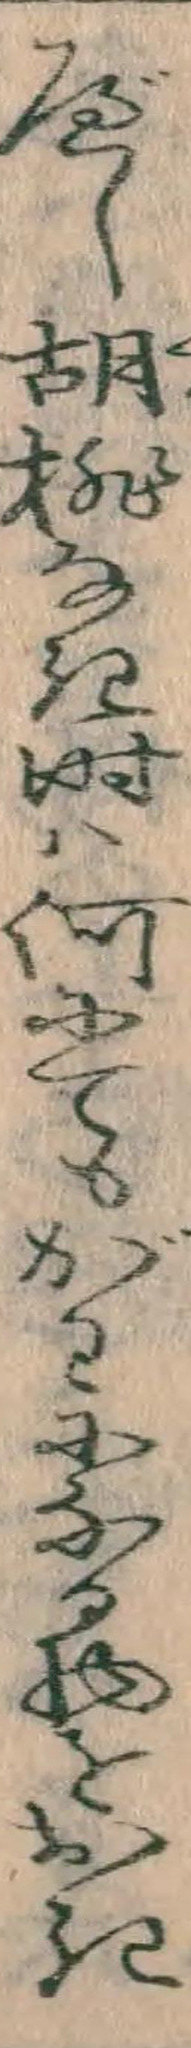べし胡桃なき時は何にてもがわになる物をおき
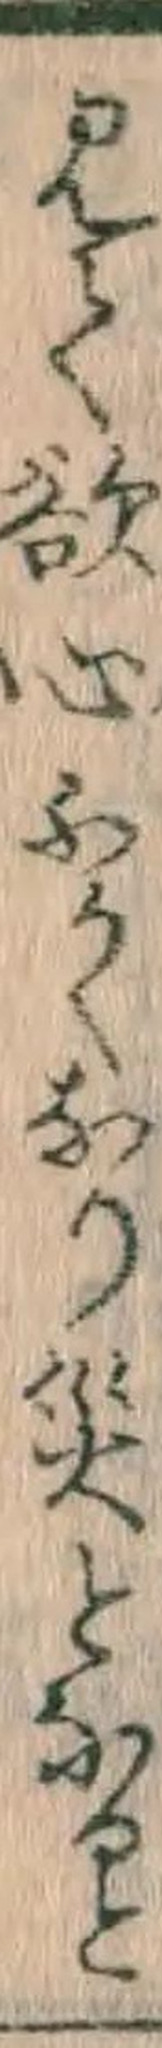見て欲心ふかくなり災となると
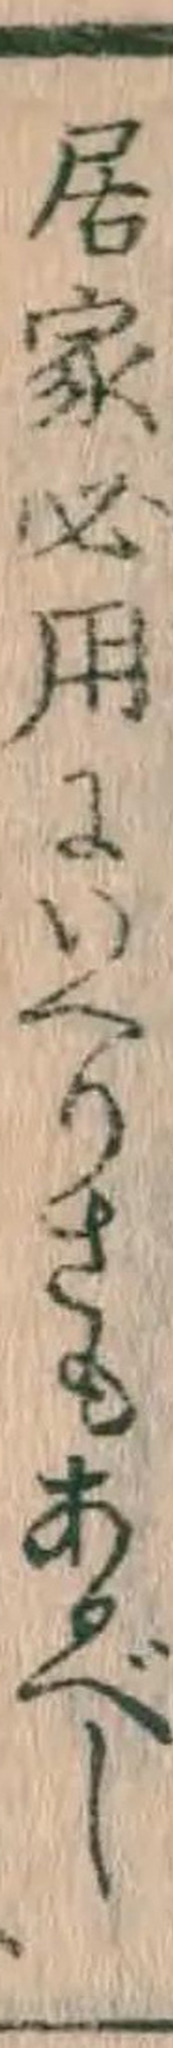居家必用にいへりさもあるべし
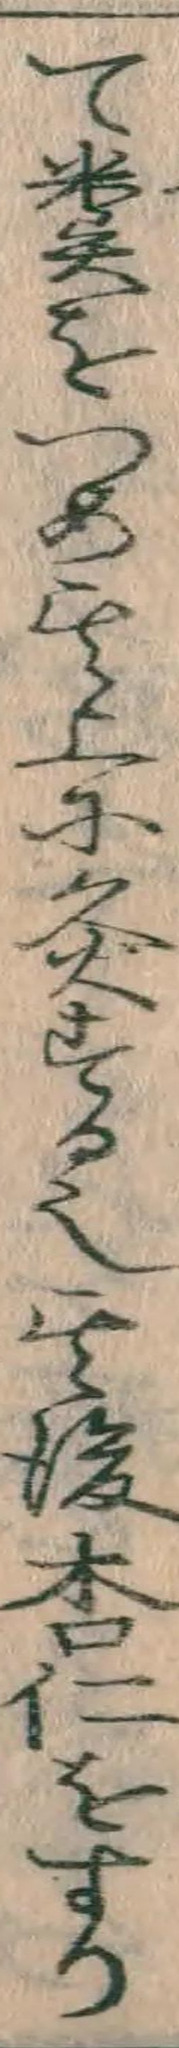て糞をつめ其上に灸する也其後杏仁をすり
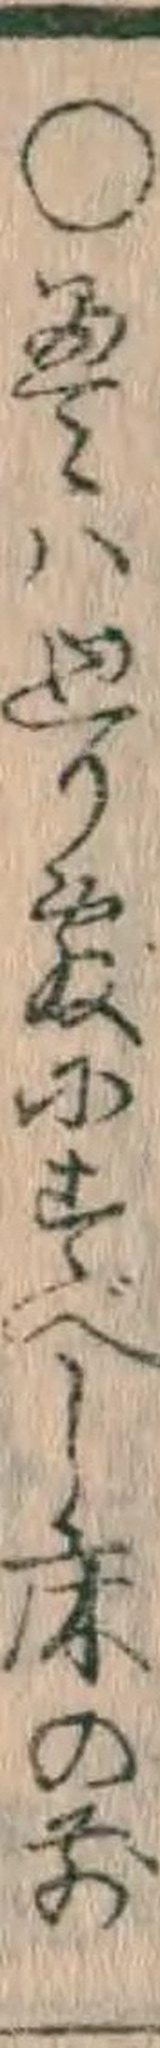○畳は廻り敷にすべし床の前
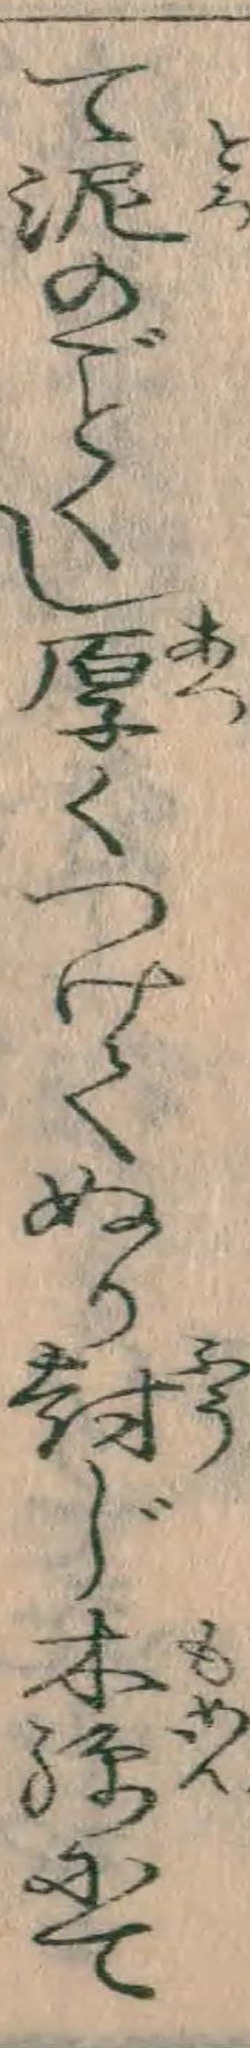て泥のごとくし厚くつけてぬり封じ木綿にて
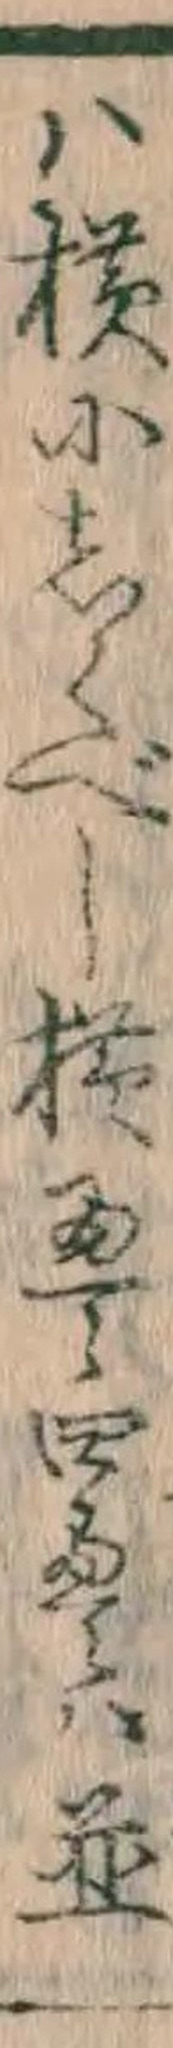は横にしくべし横畳四畳は並
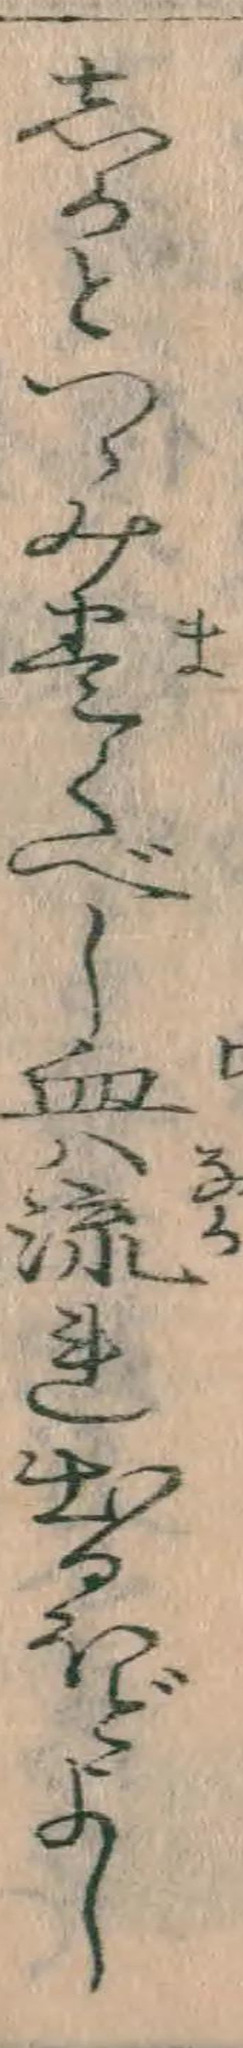しかとつゝみ巻くべし血は流れ出るほどよし
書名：広益秘事大全 3巻. [3]
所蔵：国立国会図書館 National Diet Library, JAPAN
